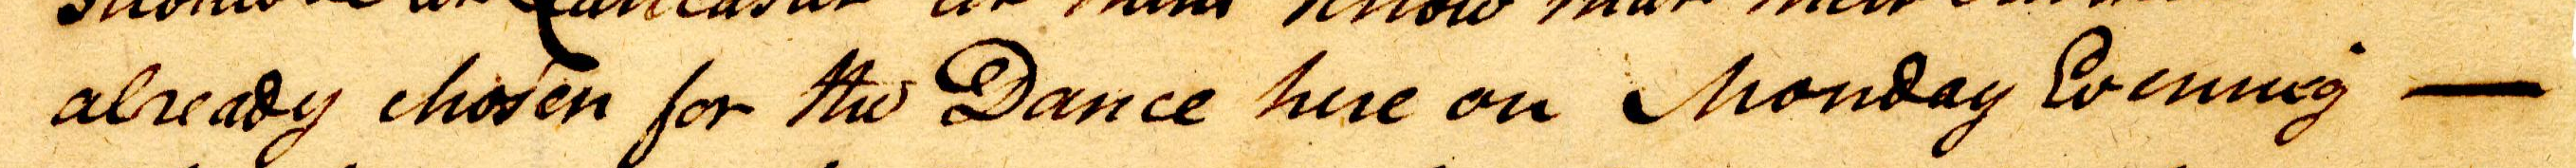already chosen for the Dance here on Monday Evening
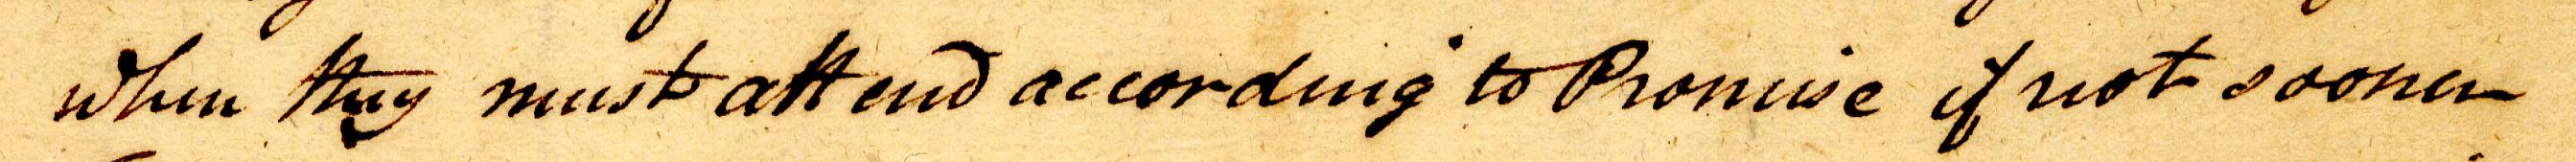when they must att end according to Promise if not sooner
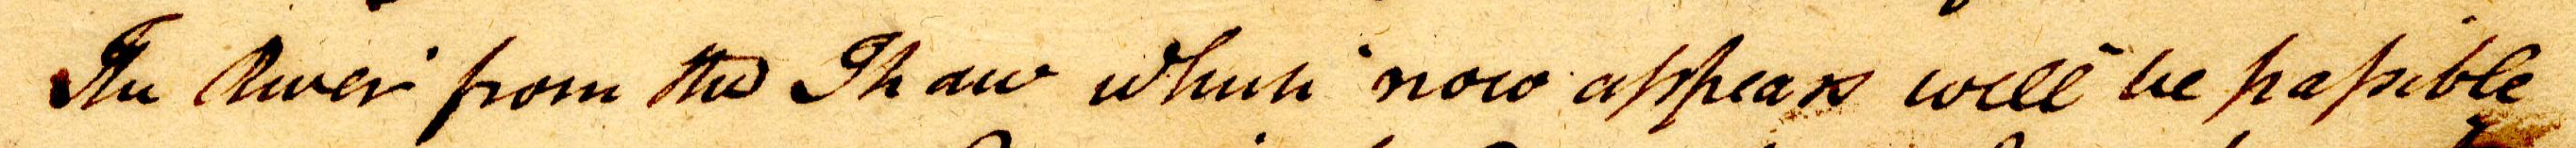The River from the Shaw which now appears will be passible
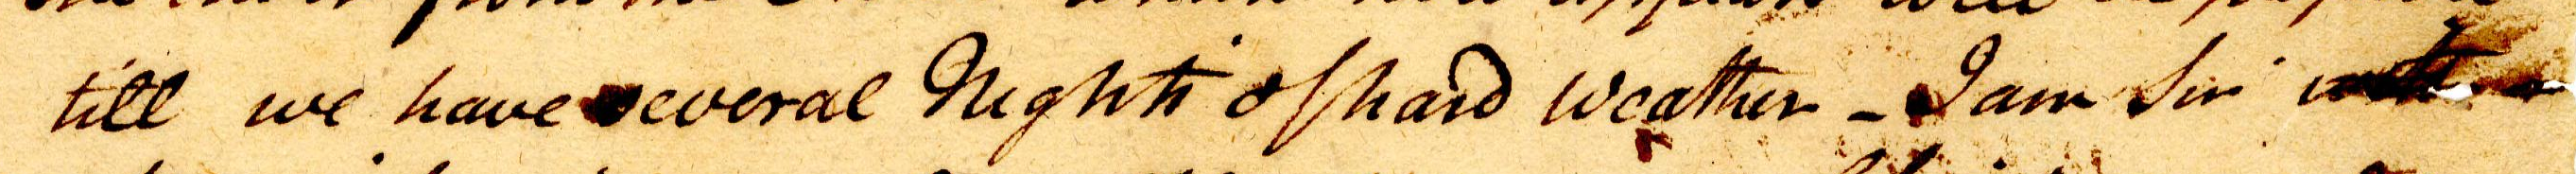till we have several Nights of hard weather. I am Sir with
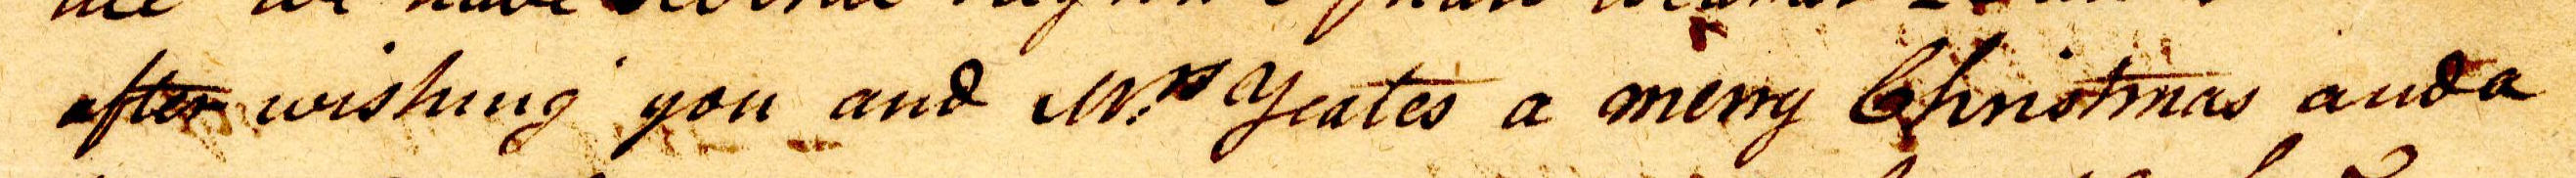after wishing you and M^rs. Yeates a merry Christmas and a
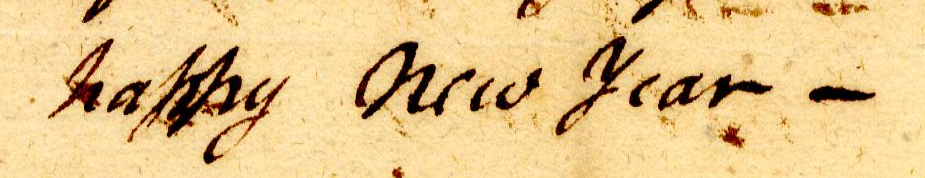happy new Year.
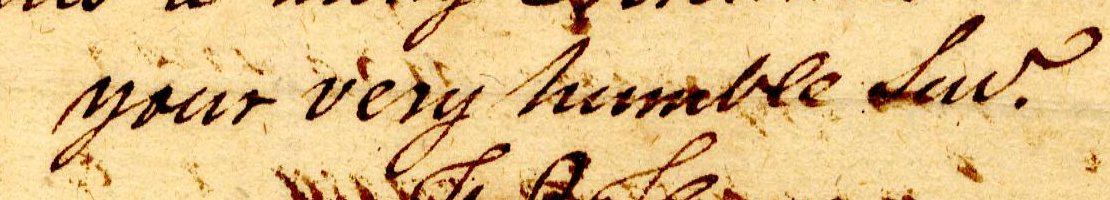your very humble Serv^t.
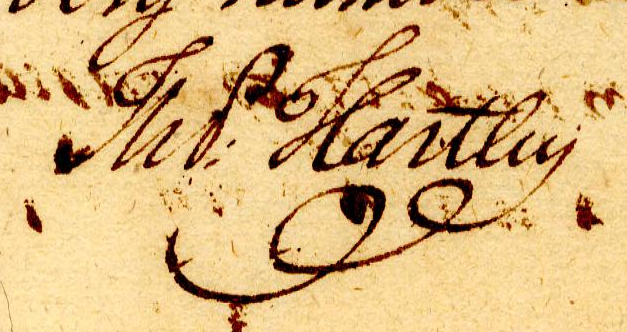Tho^s: Hartley
